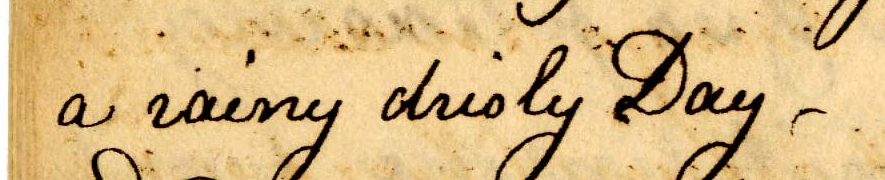a rainy drisly Day-
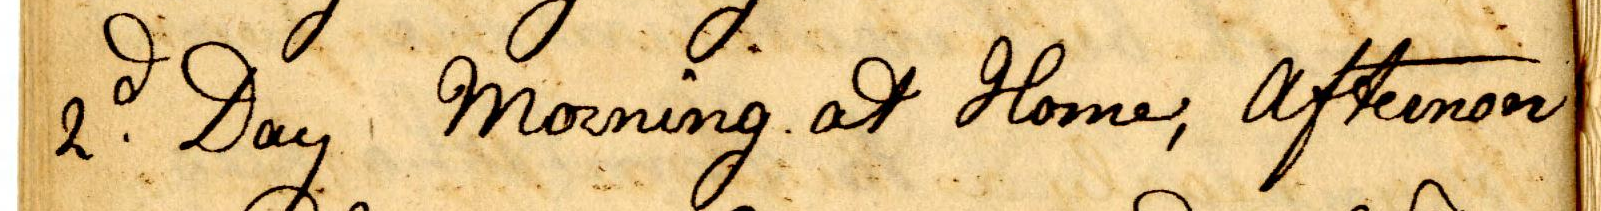2^d Day Morning at Home, Afternoon
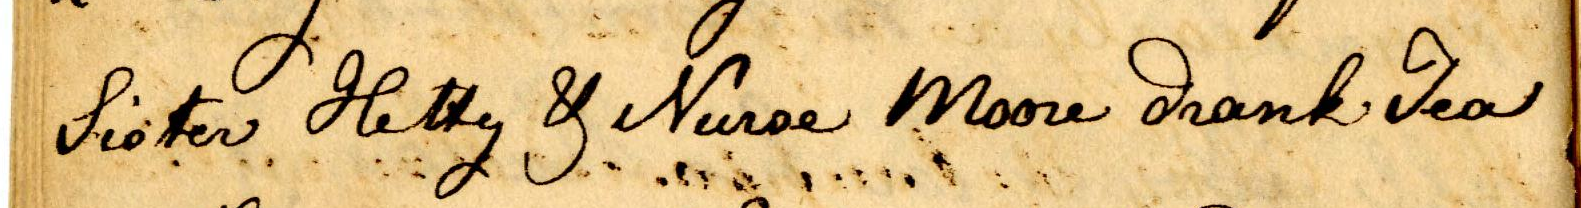Sister Hetty & Nurse Moore drank Tea
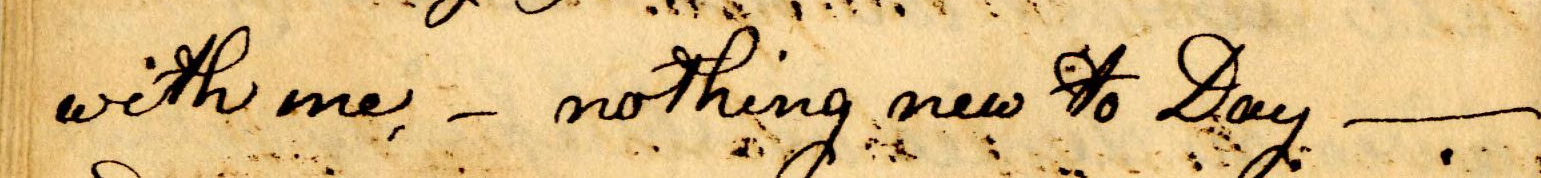with me,- nothing new to Day-
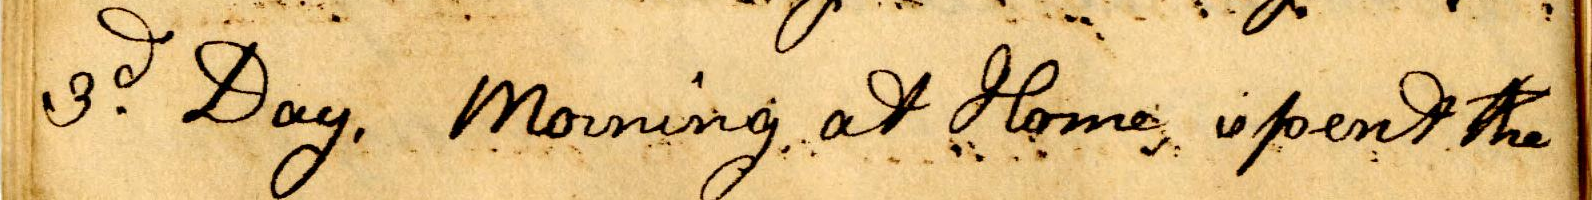3^d Day. Morning at Home, spent the
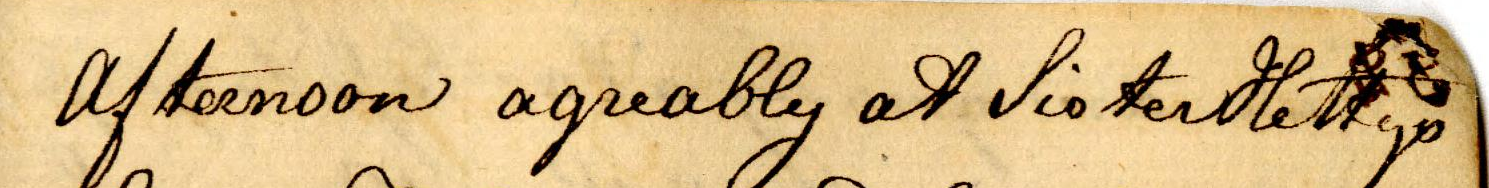Afternoon agreably at Sister Hettys
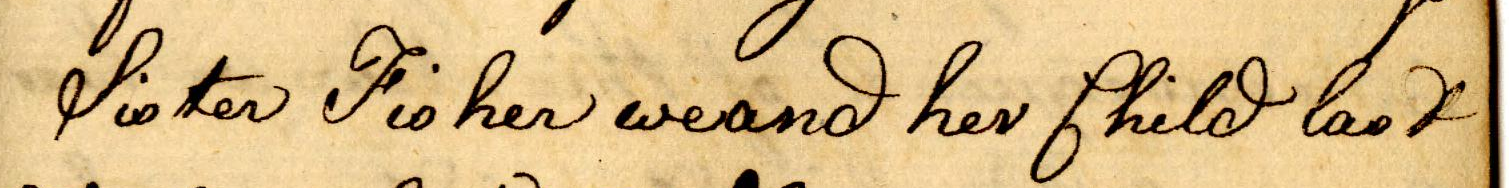Sister Fisher weand her Child last
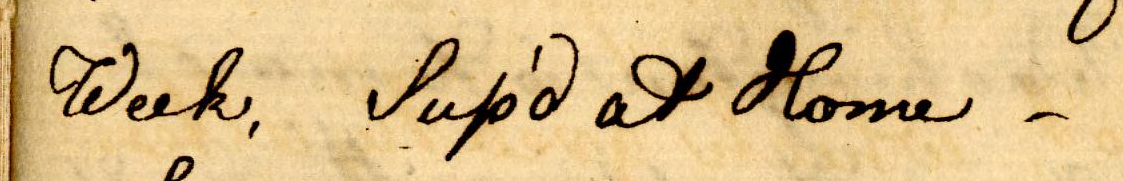Week, Sup'd at Home-
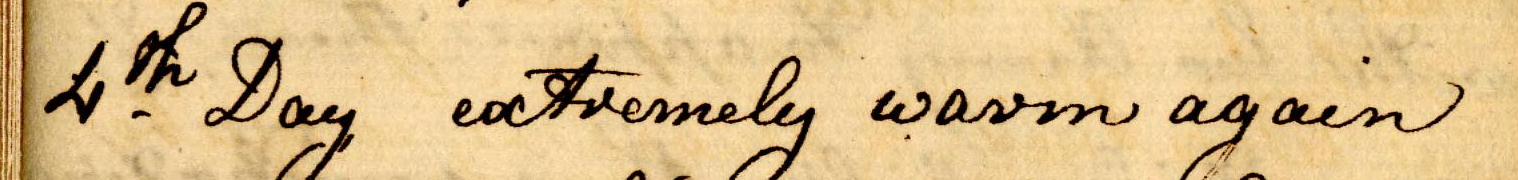4^th Day, extremely warm again
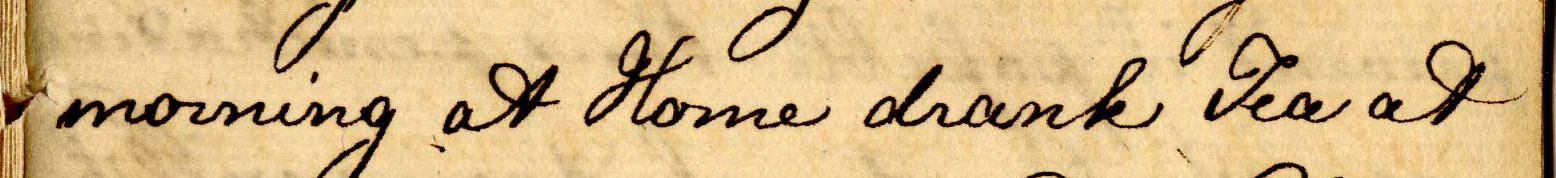morning at Home drank Tea at
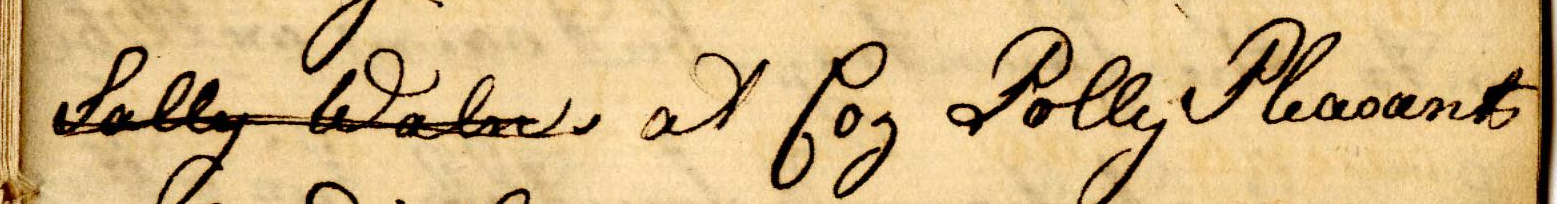[Sally Waln] at Coz Polly Pleasants
